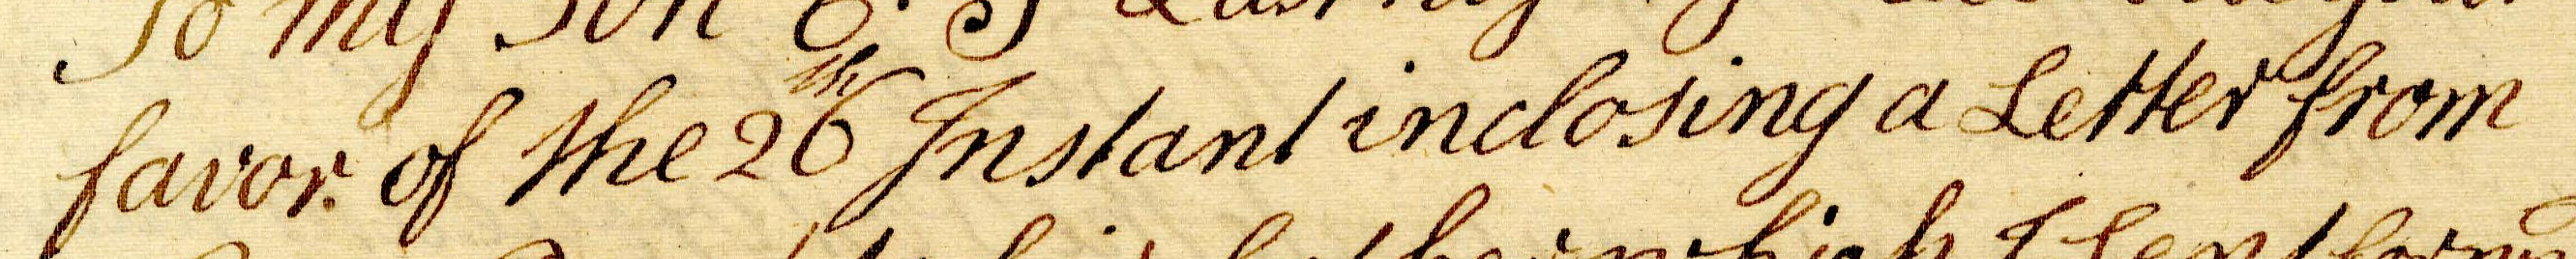favor. of the 26^th Instant inclosing a Letter from
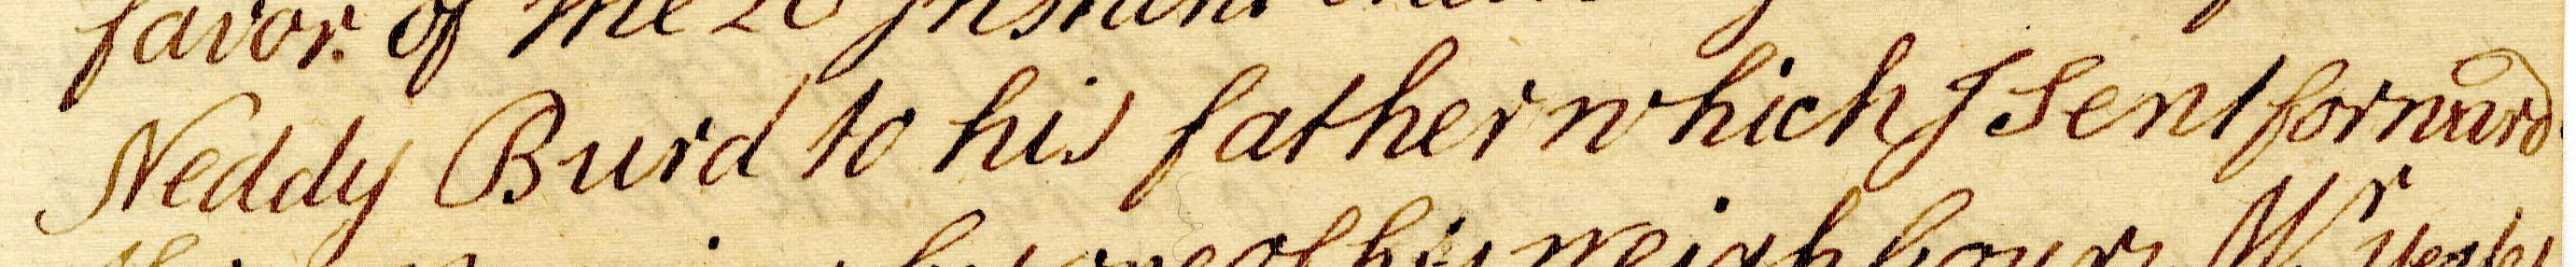Neddy Burd to his father which I sent forward
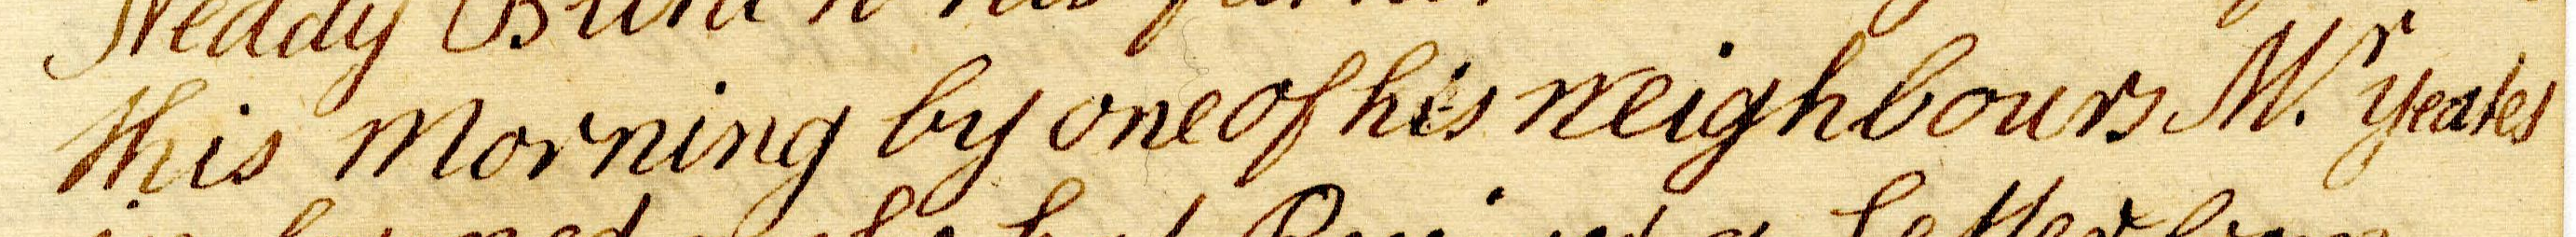this Morning by one of his neighbours M^r. Yeates
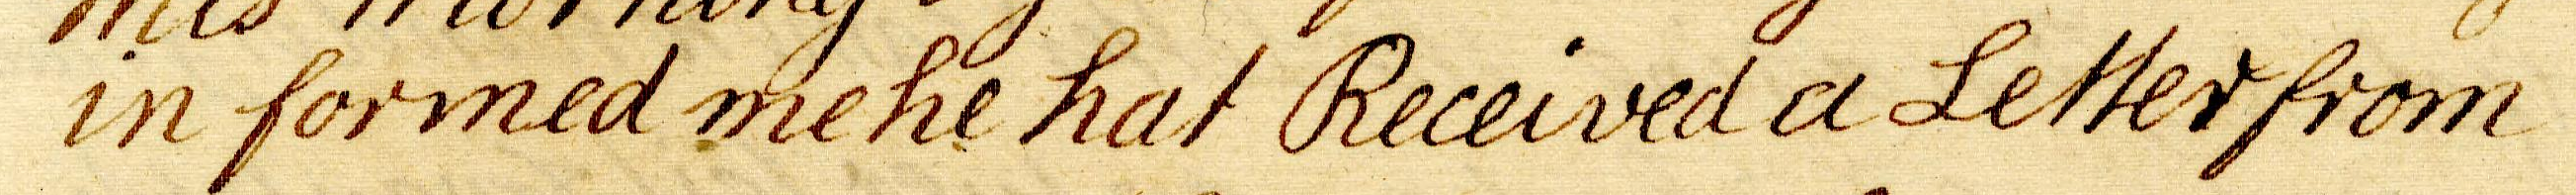in formed mw he hat Received a Letter from
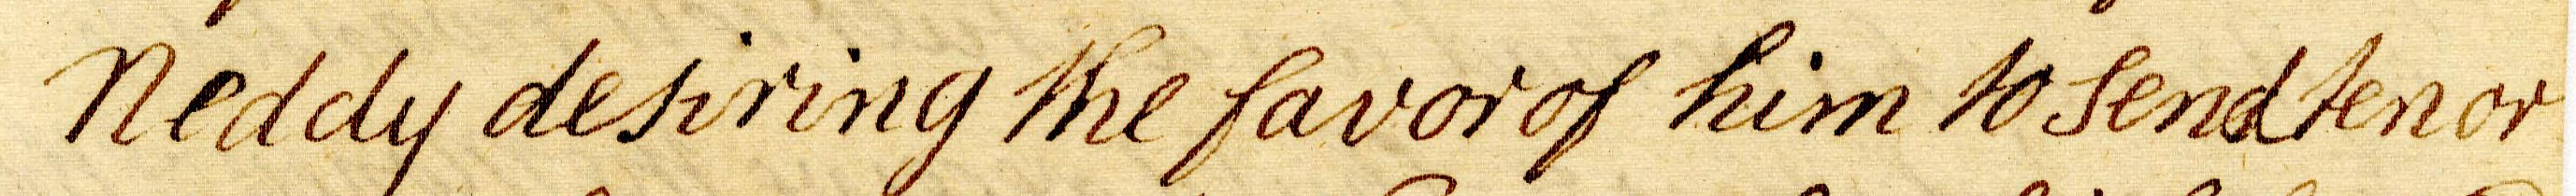Neddy desiring the favor of him to send ten or
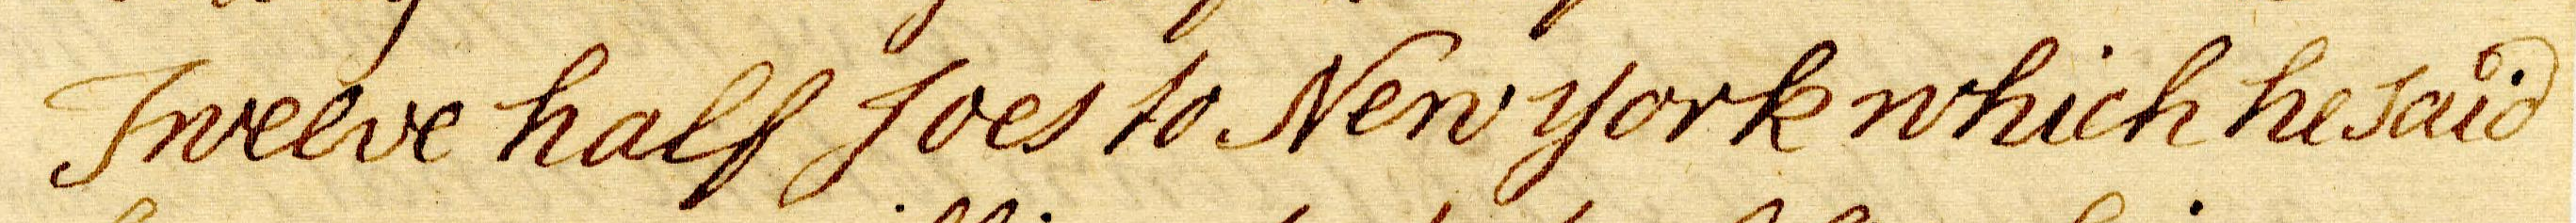Twelve half Joes to New York which he said
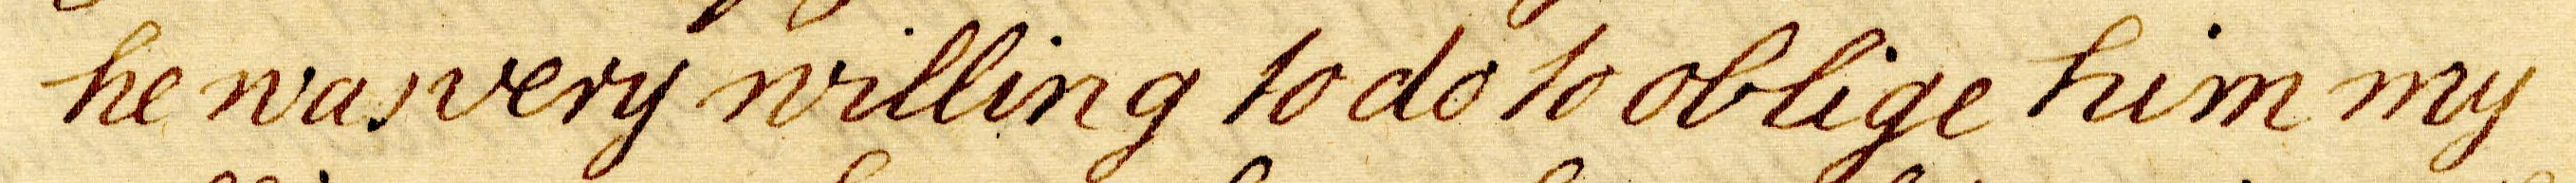he was very willing to do to oblige him my
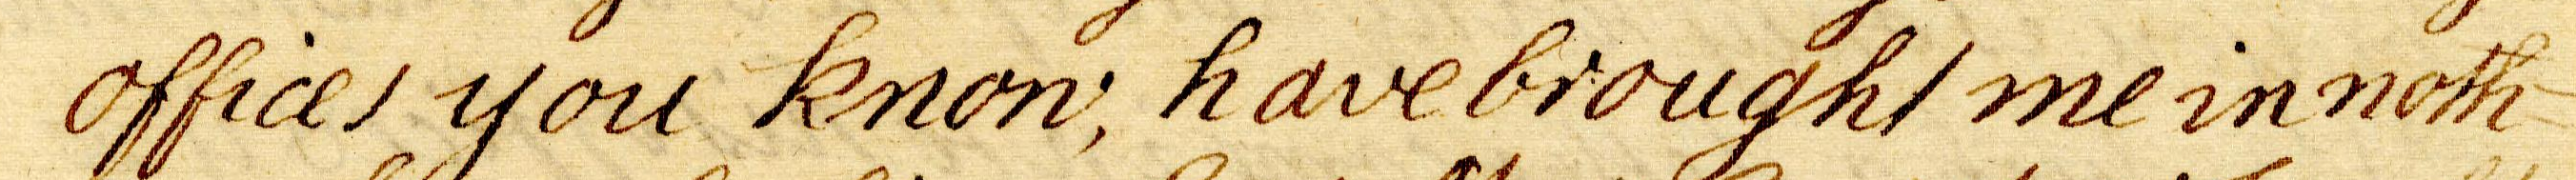Offices you know, have brought me in noth-
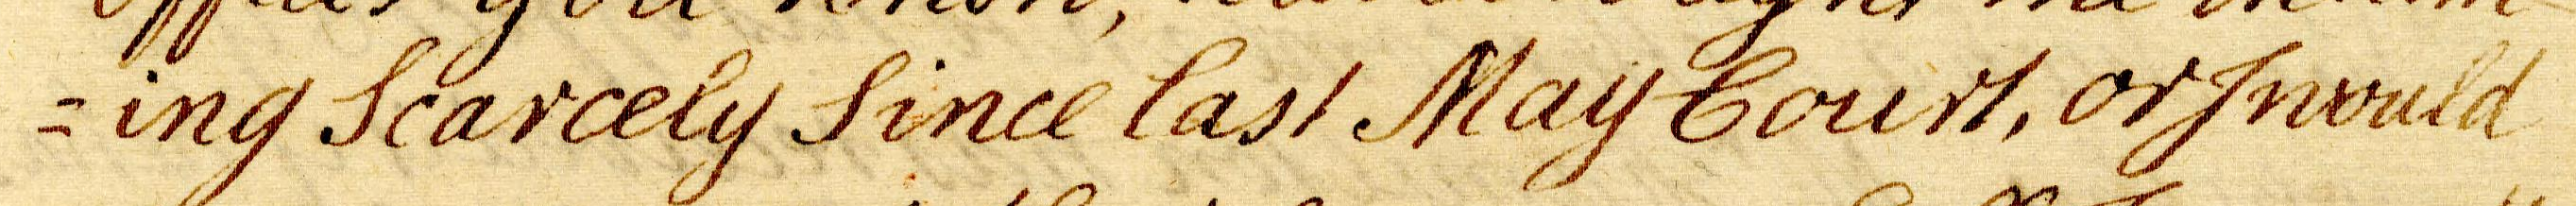-ing Scarcely Since last May Court, or I would
